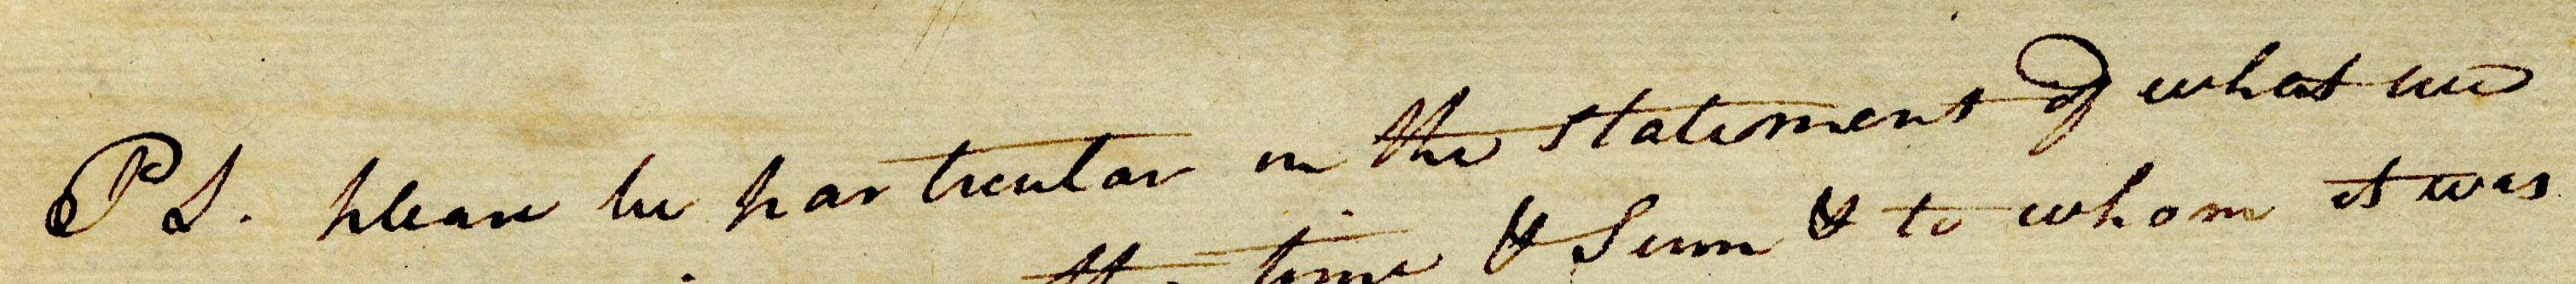P.S. please be particular in the statements of what we
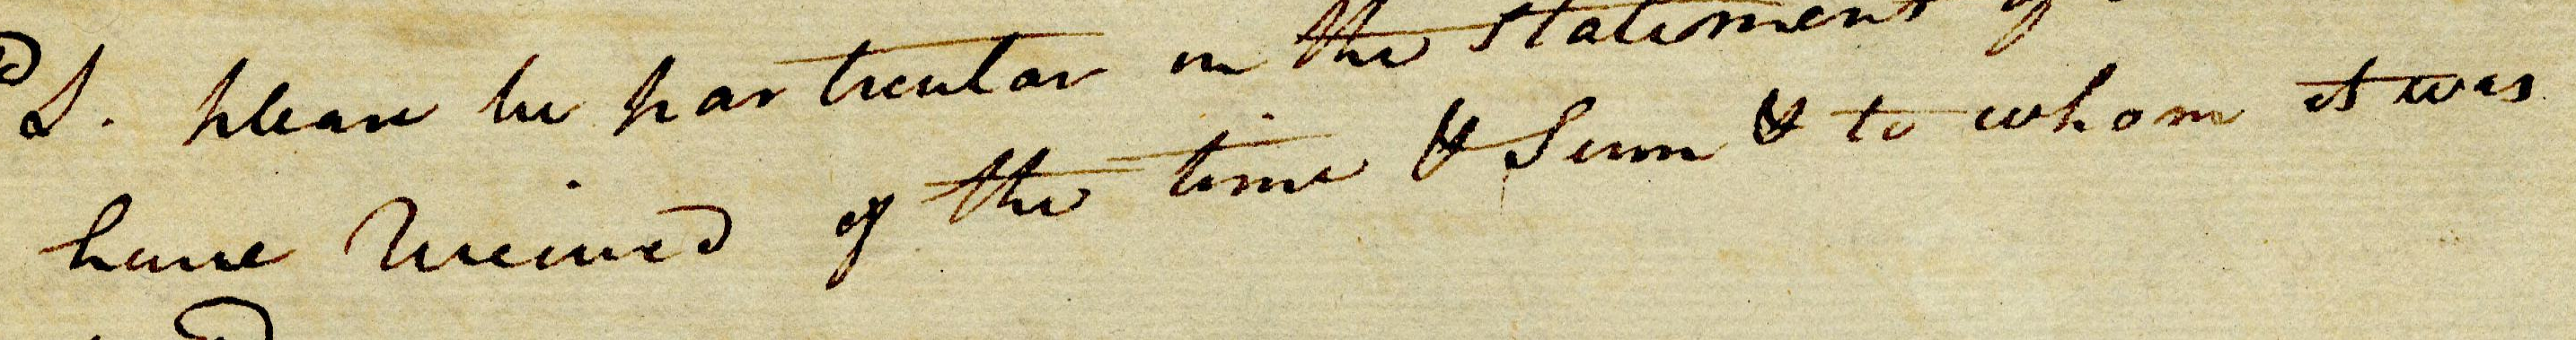have received of the time & sum & to whom it was
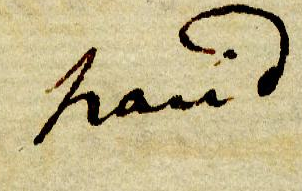paid
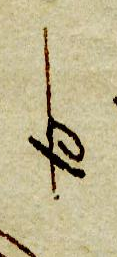to
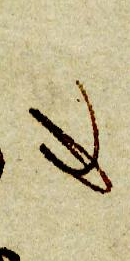&
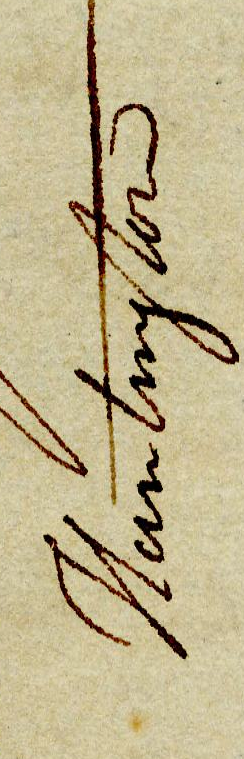Huntington
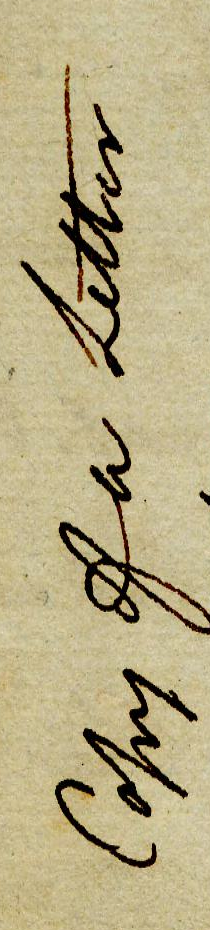Copy of a Letter
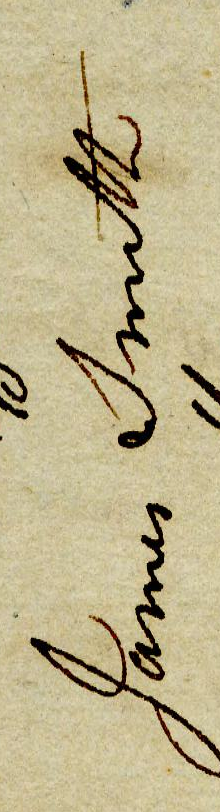James Smith
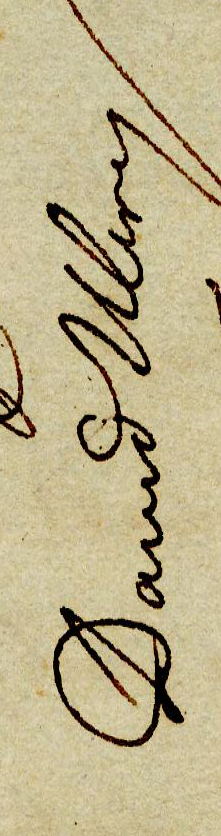David Uleny
